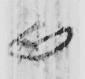㠯（以）
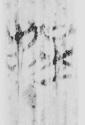{女日朿}
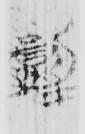勛
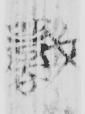戰
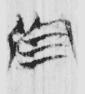於
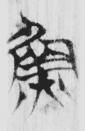魚
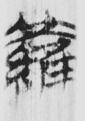羅
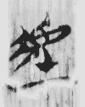𫊟
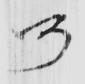乃
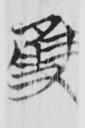雘
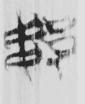{邑𣐺}
